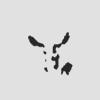又
